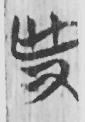拃（作）
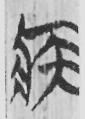疾
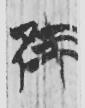隹
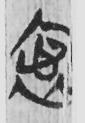{衣心}
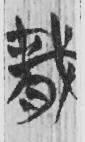胾
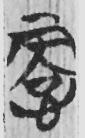{丙心}
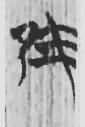隹
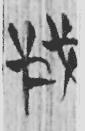{干戈}
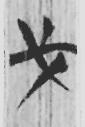戈
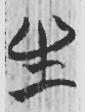生
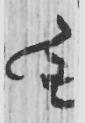氒
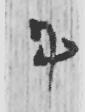身
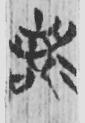若
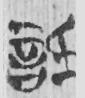詆
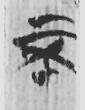不
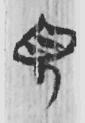見
